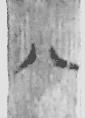八
